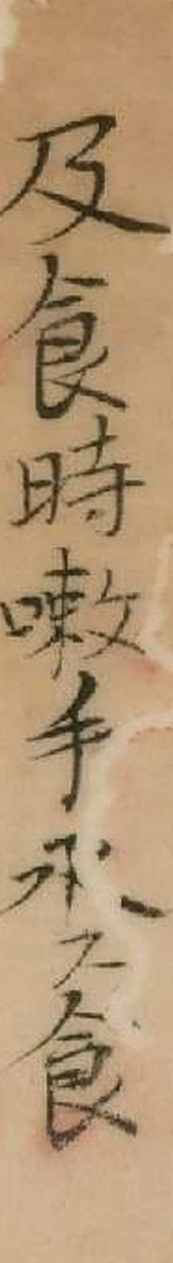及食時嗽手水ス食
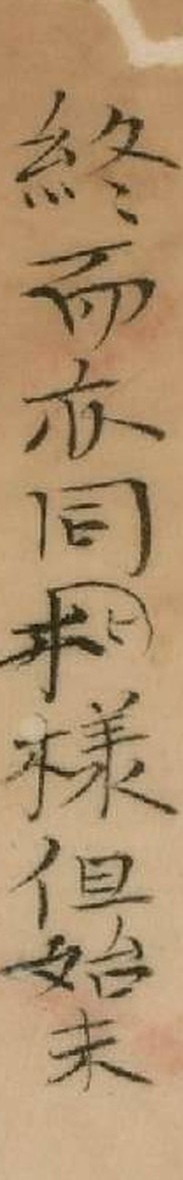終而亦同様但始末
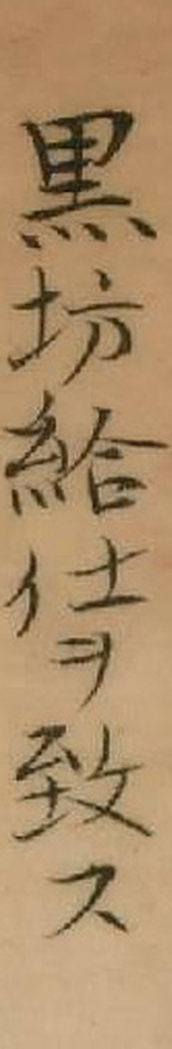黒坊給仕ヲ致ス
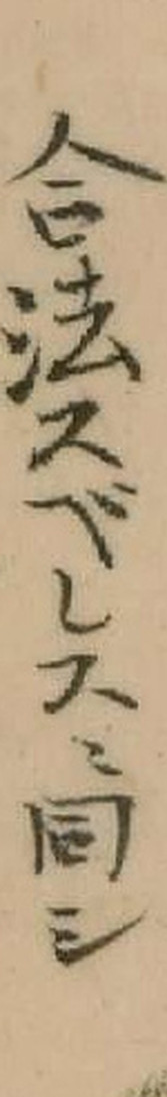合法スベレスニ同シ
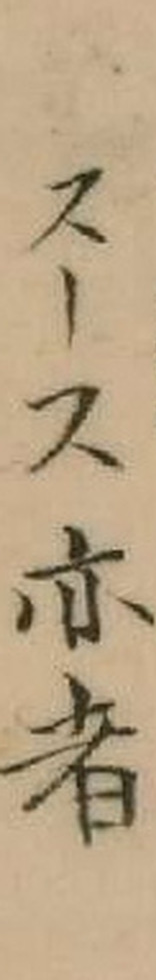スース亦者
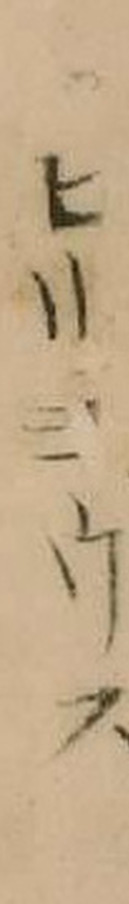ヒリミウス

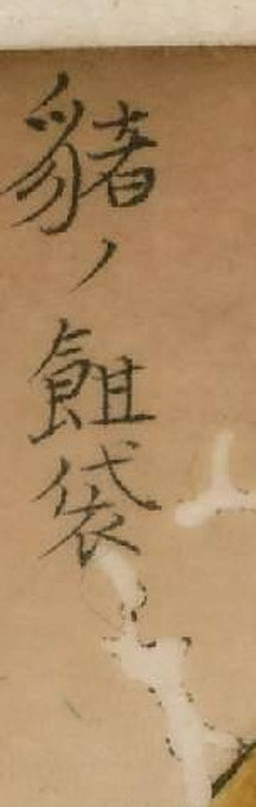猪ノ𩚵袋
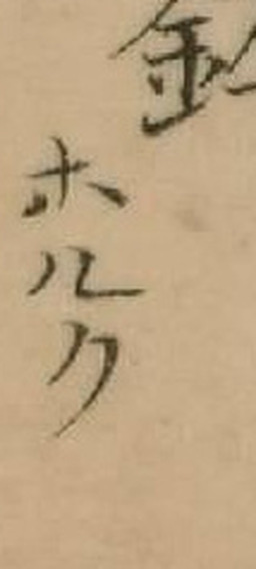ホルク
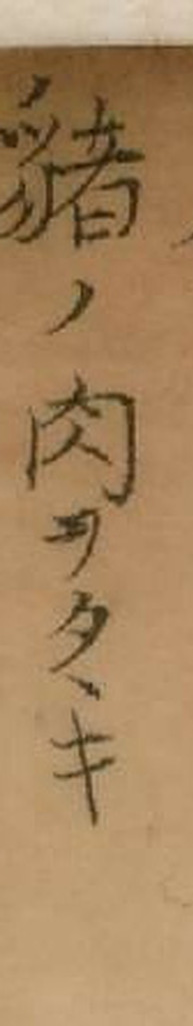猪ノ肉ヲタヽキ
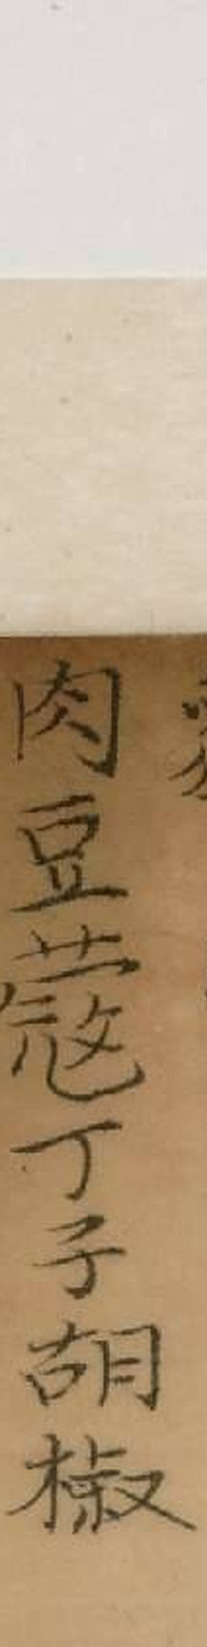肉豆蒄丁子胡椒
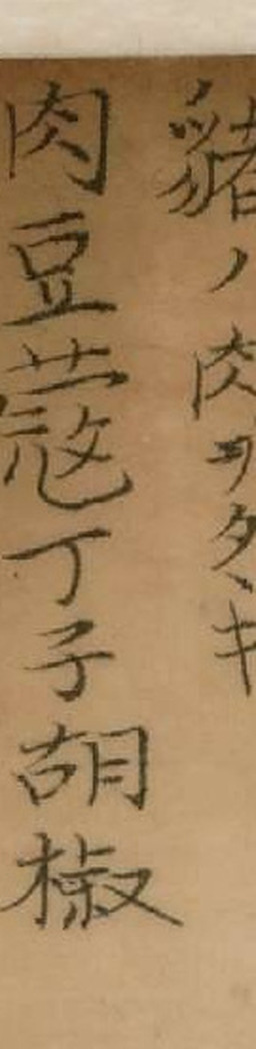肉豆蒄丁子胡椒
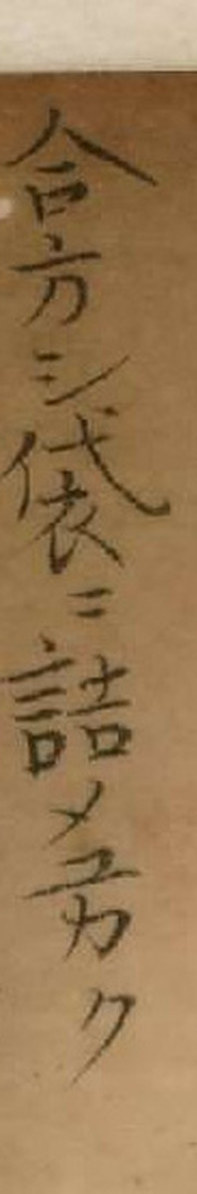合方シ袋ニ詰メユカク
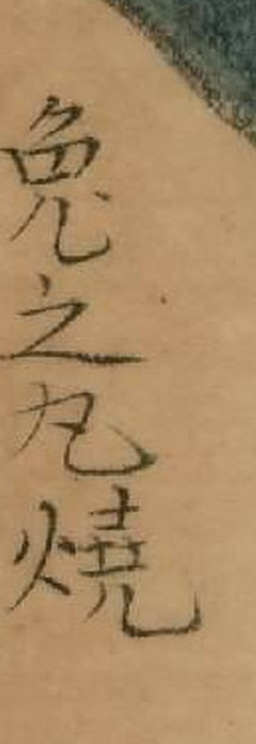兎之丸焼
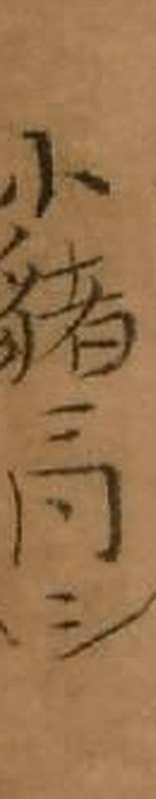小猪ニ同シ
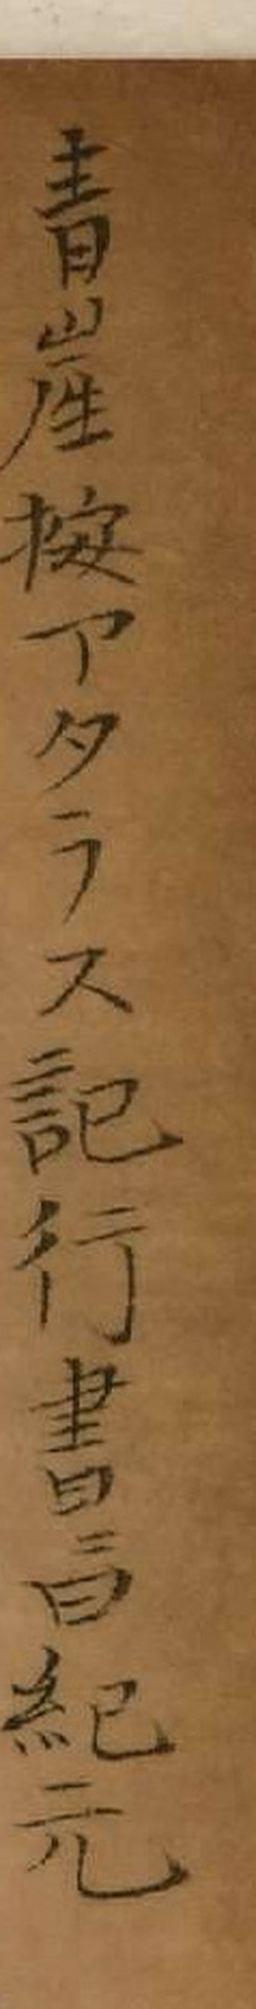青按アタラス記行書ニ曰紀元
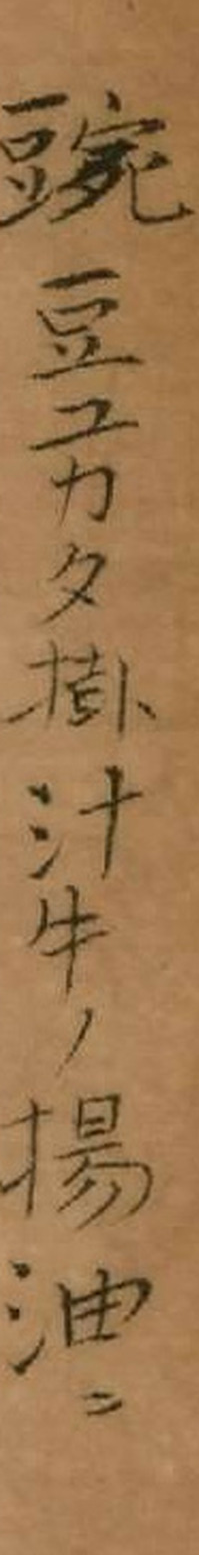豌豆ユカタ掛汁牛ノ揚油ニ
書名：和蘭規式料理絵図
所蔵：神戸大学附属図書館 国文学研究資料館
